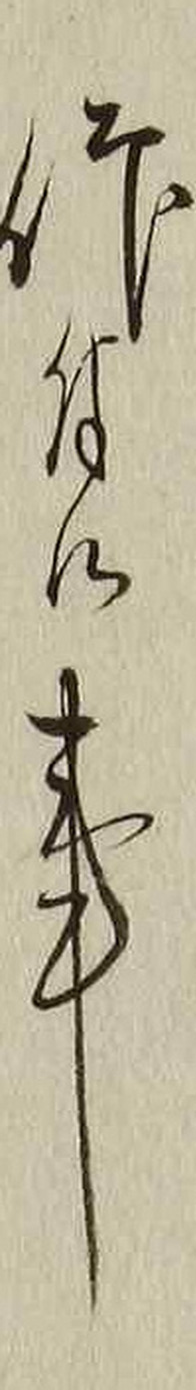仰付候事
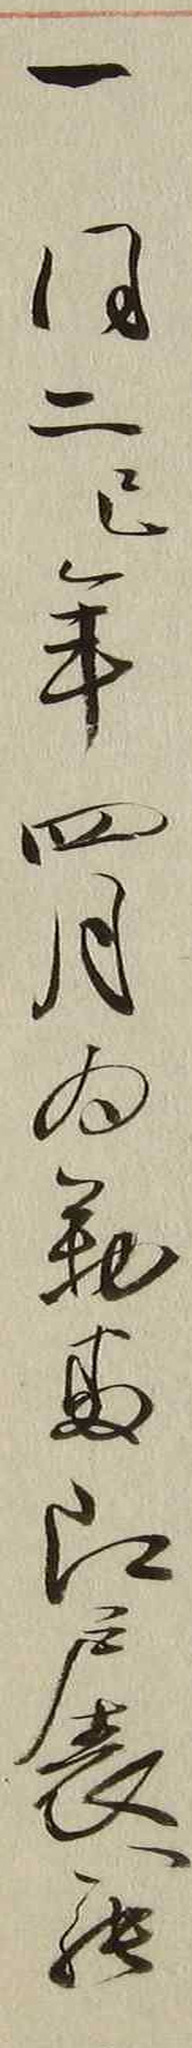一同二巳年四月為勤番江戸表へ罷
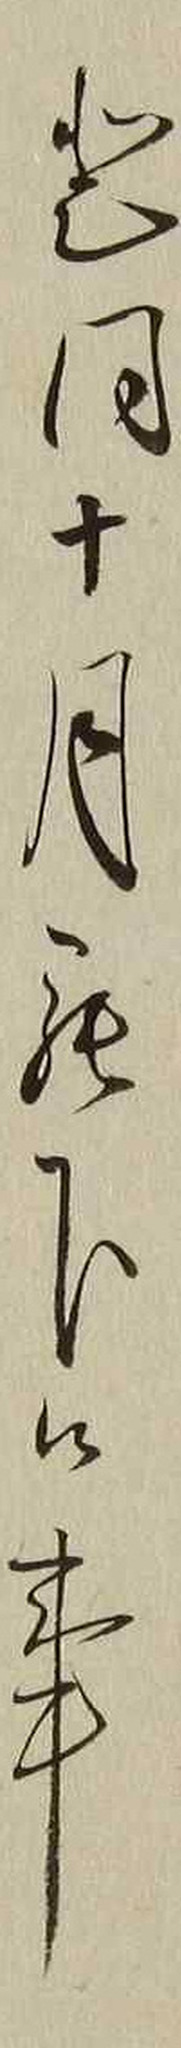登同十月罷下候事
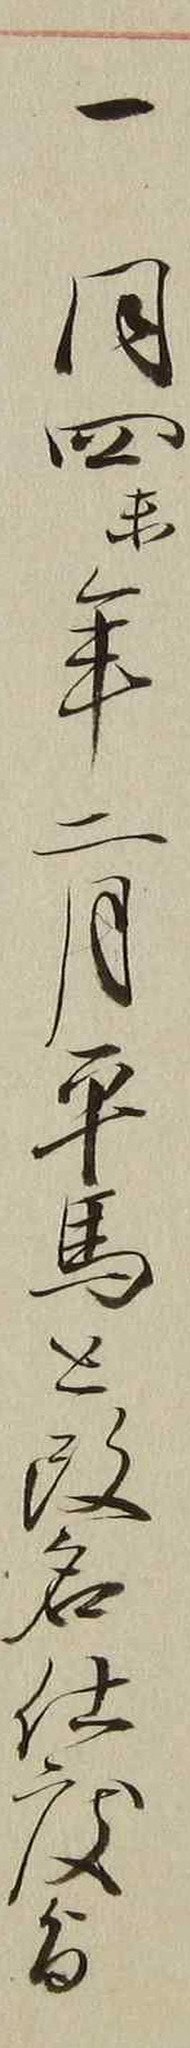一同四末年二月平馬と改名仕度旨
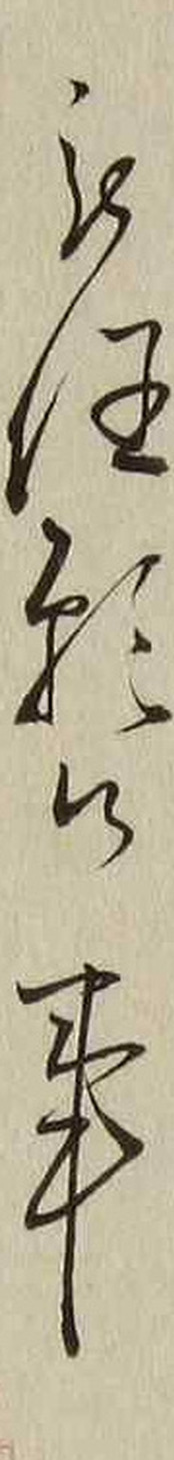被任願候事
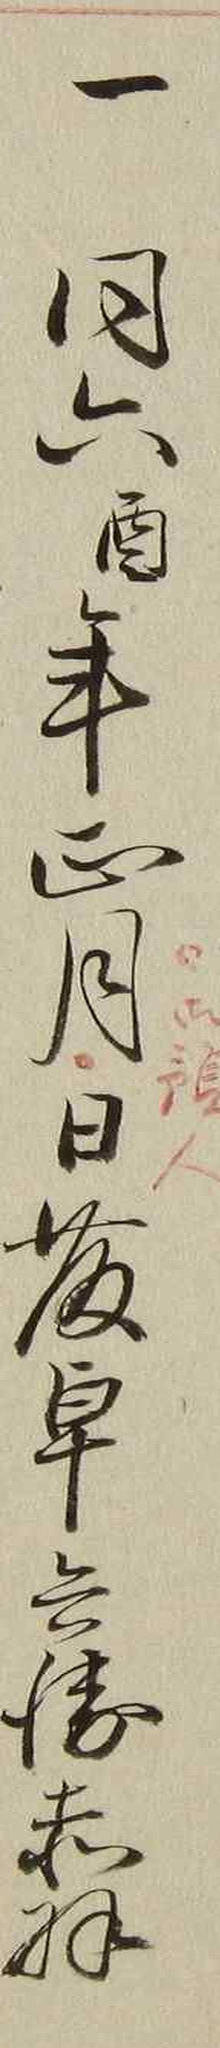一同六酉年正月御預人日藤卓兵衛赤羽
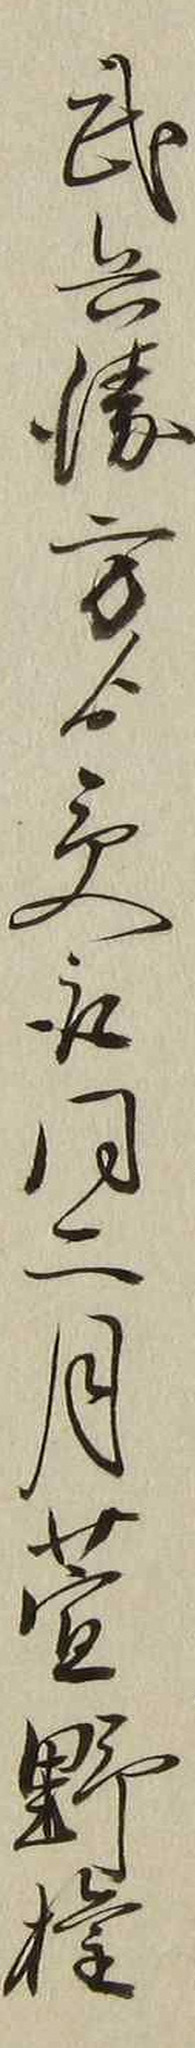武兵衛方ゟ受取同二月萱野権
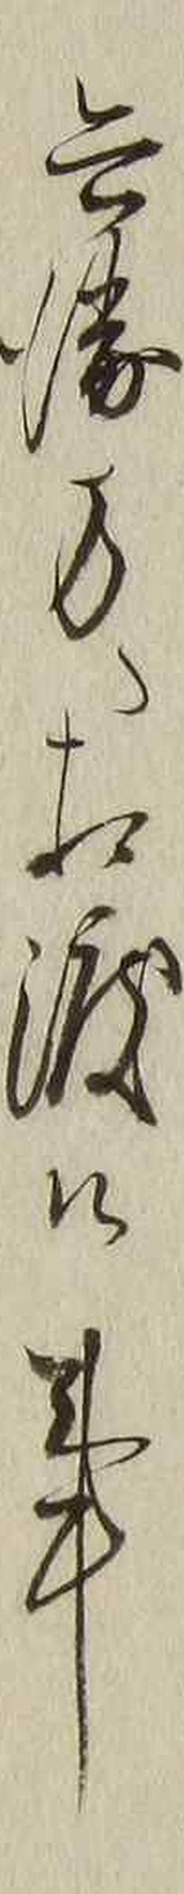兵衛方へ相渡候事
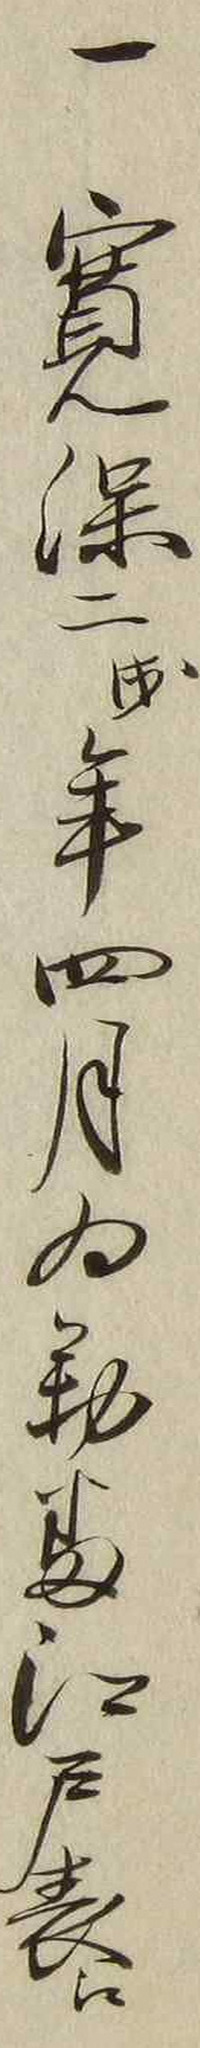一寛保二成年四月為勤番江戸表江
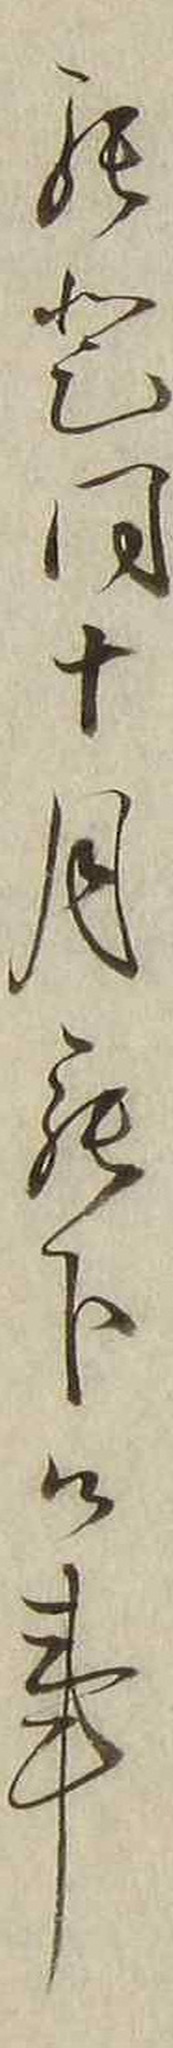罷登同十月罷下候事
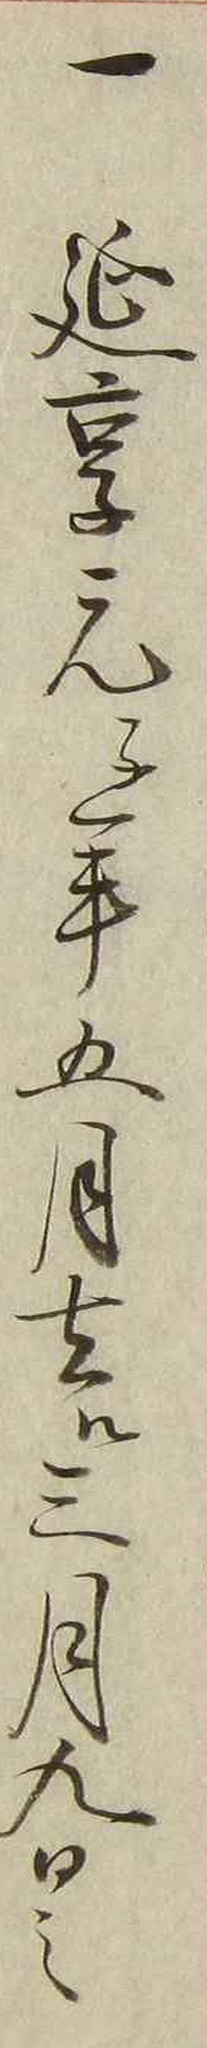一延享元子年五月去る三月九日之
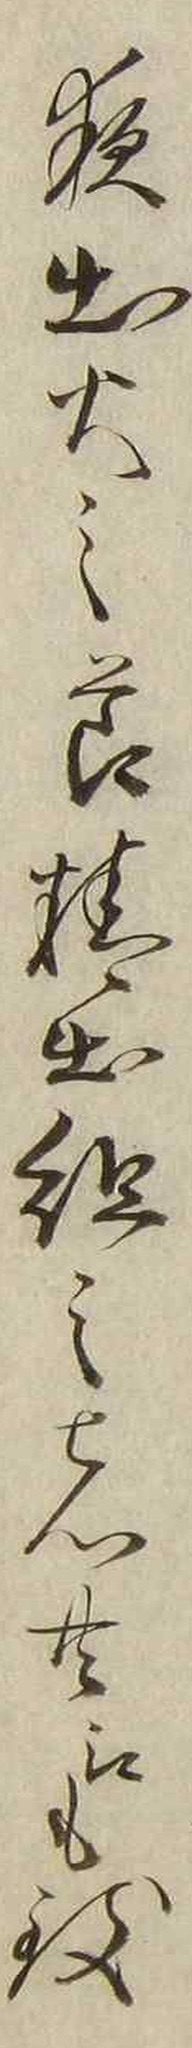夜出火之節精出組之者共江も致

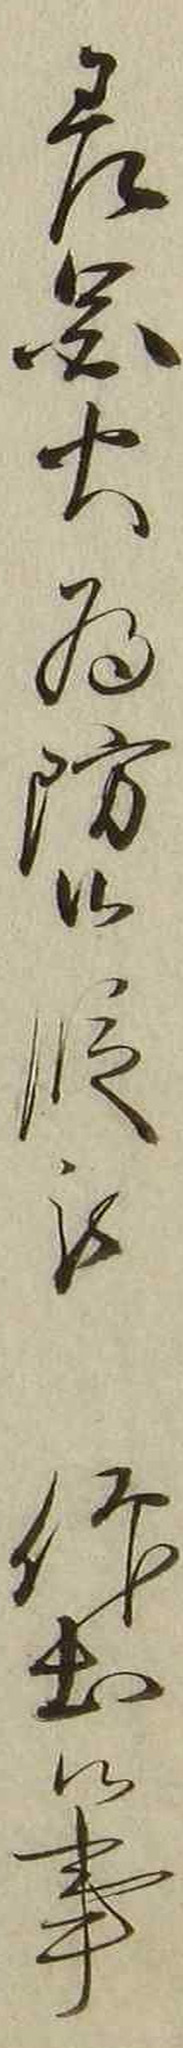差図火為防候段被仰出候事
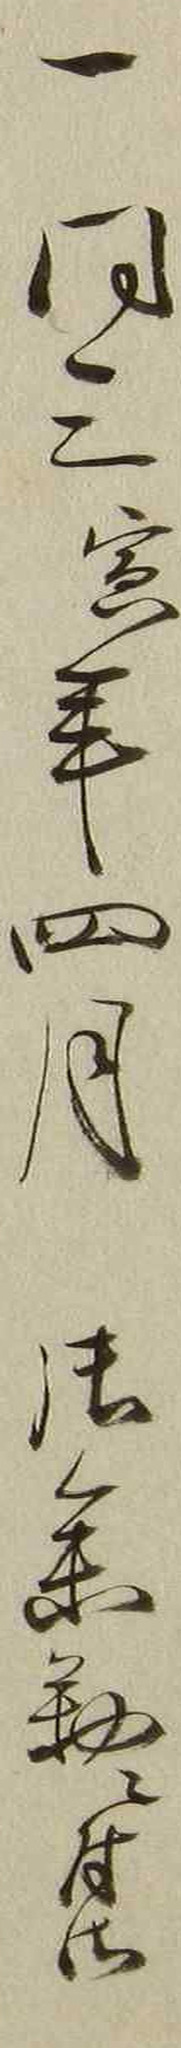一同三寅年四月御参勤に付御
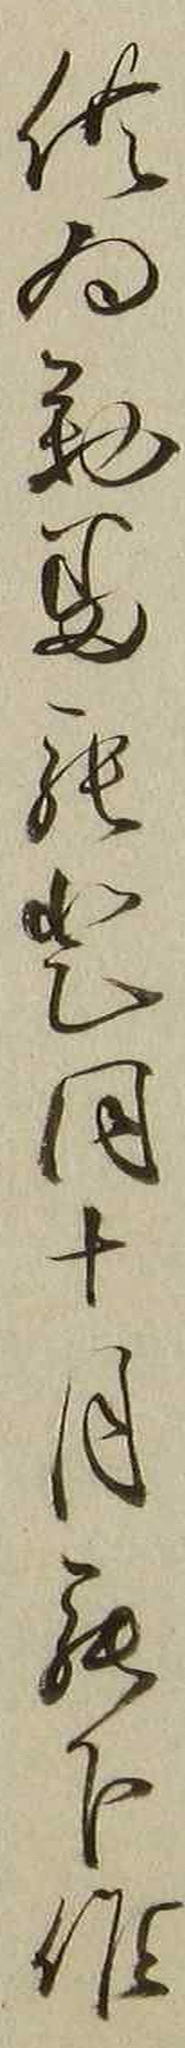供為勤番罷登同十月罷下候
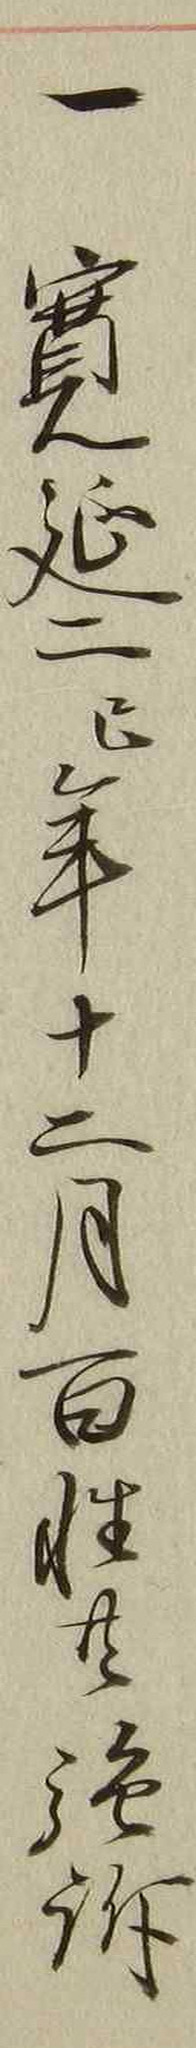一寛延二巳年十二月百性共強訴
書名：諸士系譜　巻之103　か之部11
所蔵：会津若松市立会津図書館
